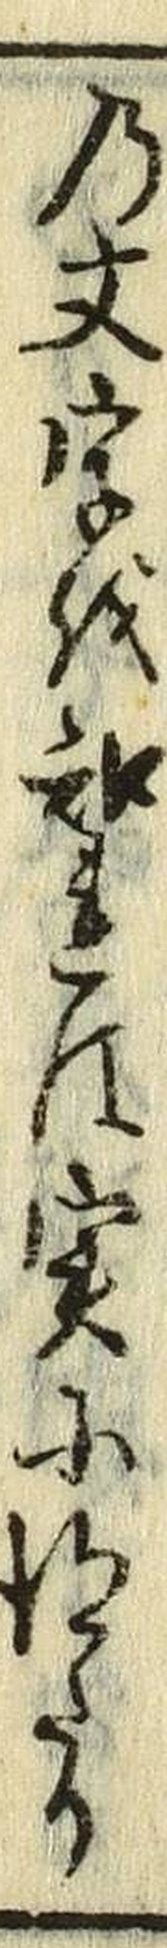の文字を知れは実に得たり
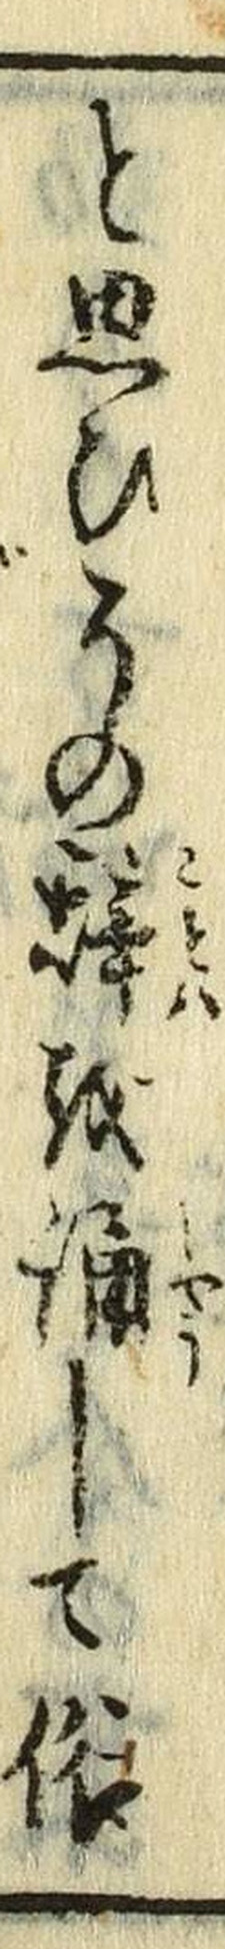と思ひその辞を誦して俗
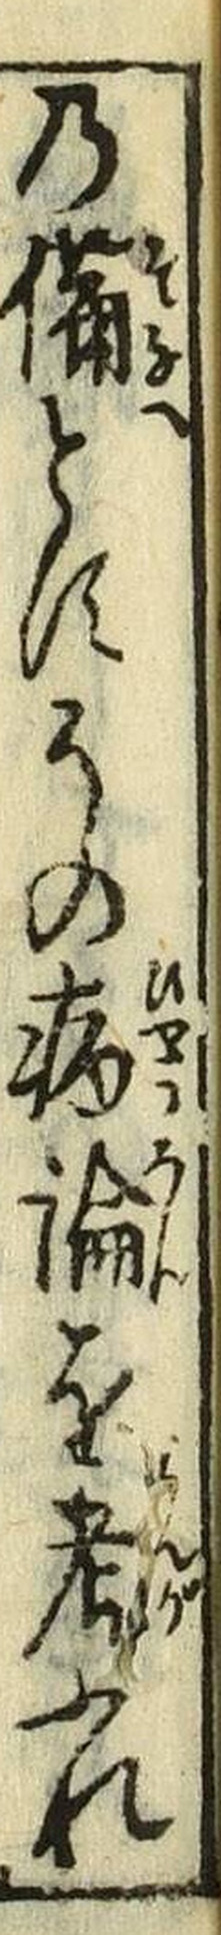の備とすその病論を考ふれ
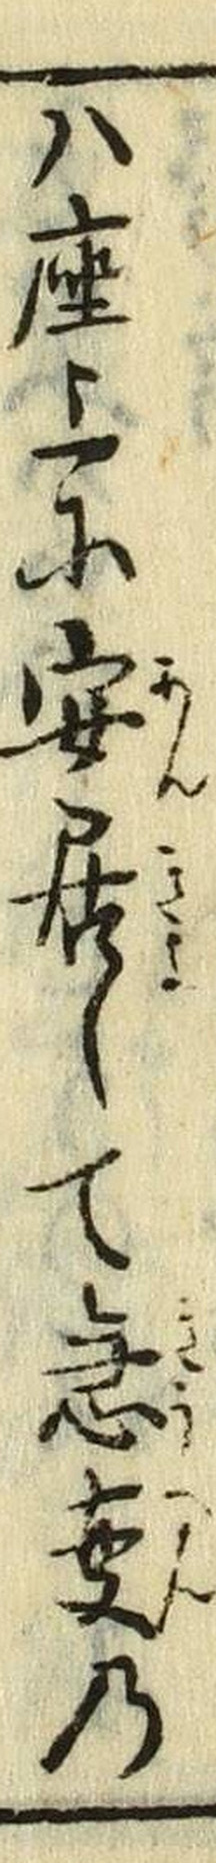は座上に安居して急変の
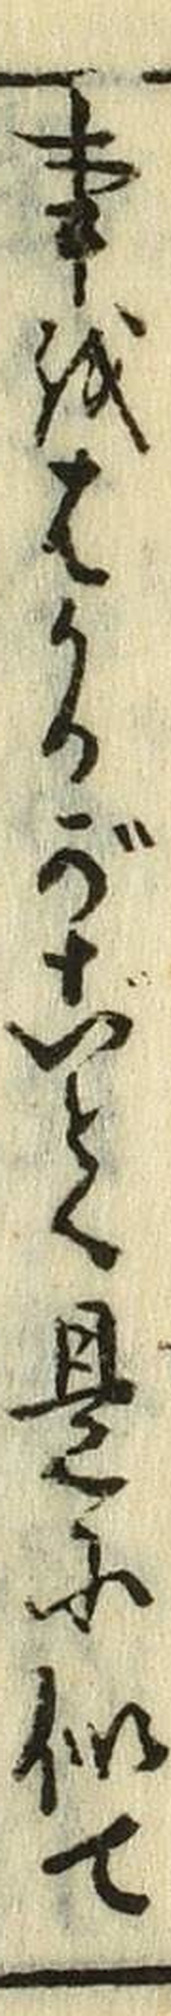事をはかるがごとく是に似て
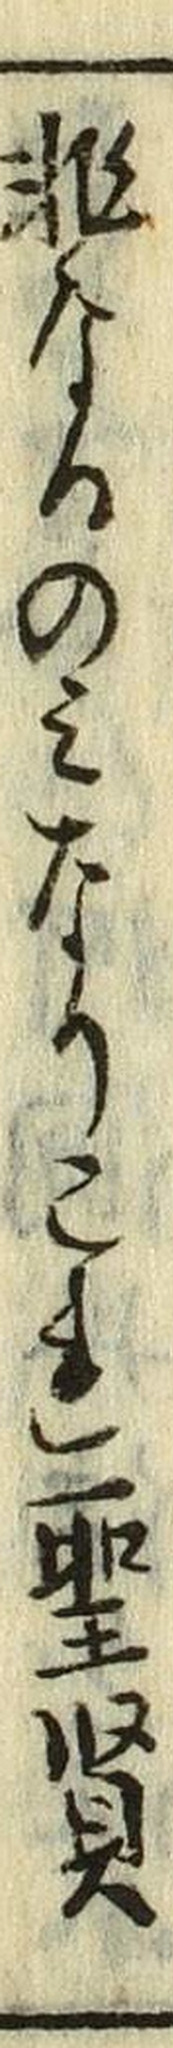非なるのみなりこれ聖賢
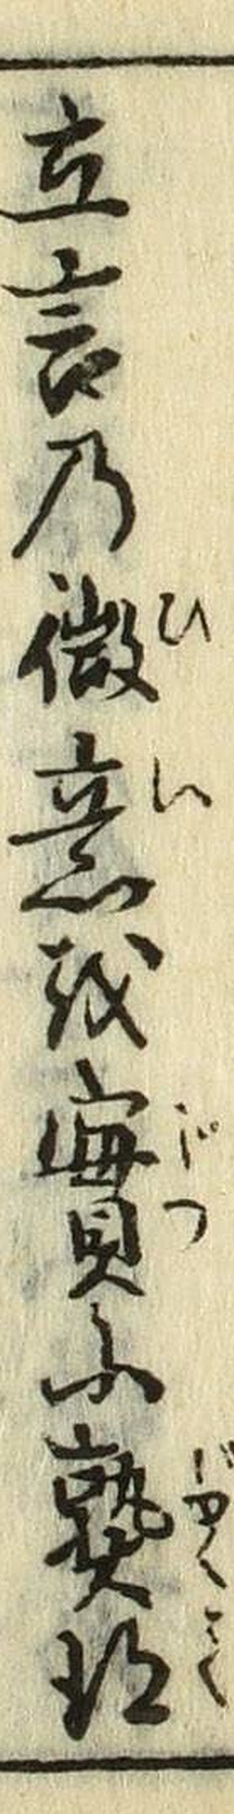立言の微意を実に熟得
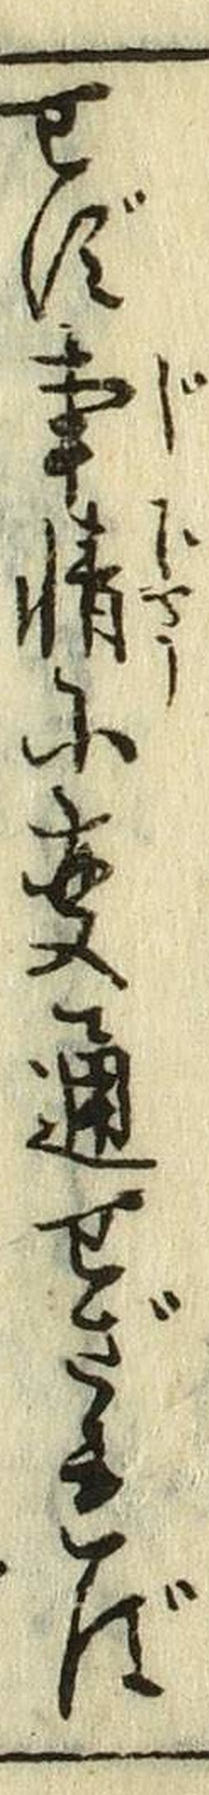せず事情に変通せざれば
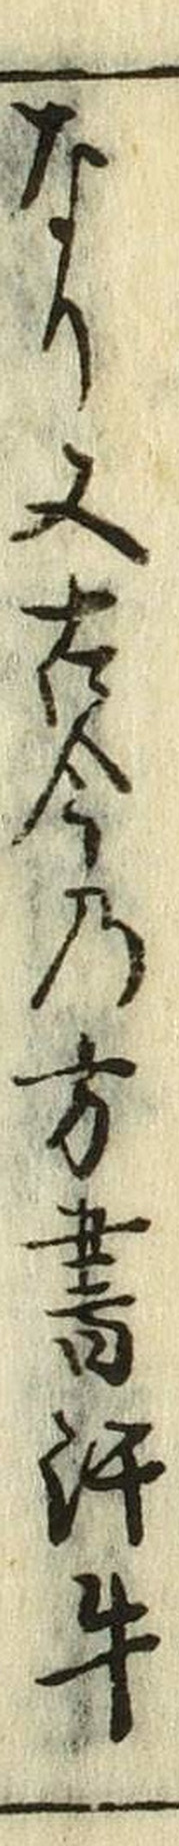なり又古今の方書汗牛
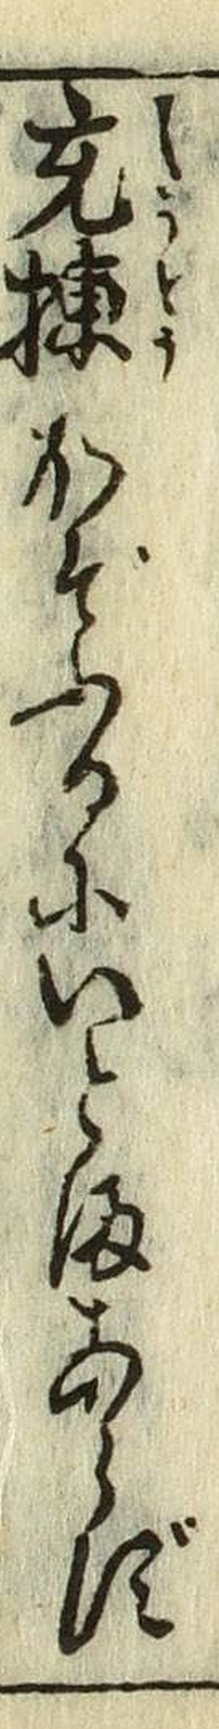充棟かぞふるにいとまあらず
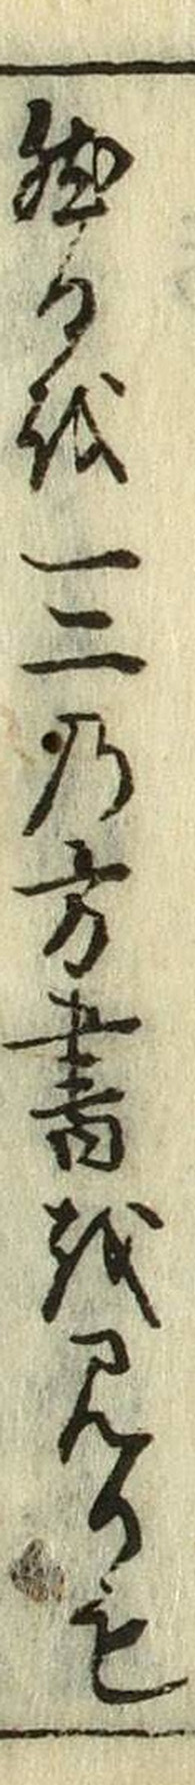然るを一二の方書を見るも
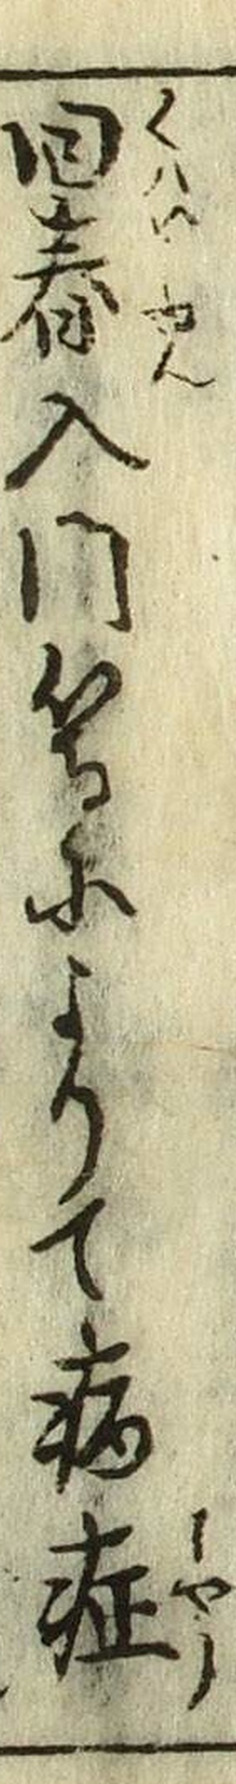回春入門等によりて病症
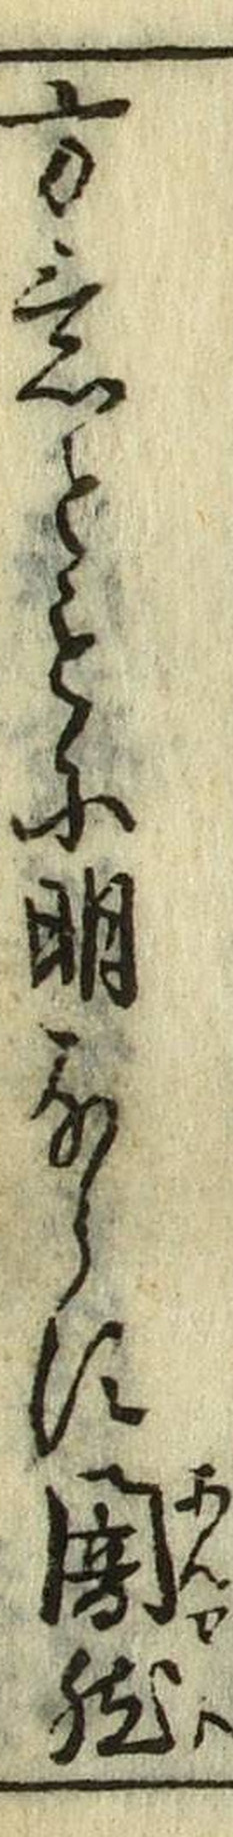方意ともに明ならす闇然

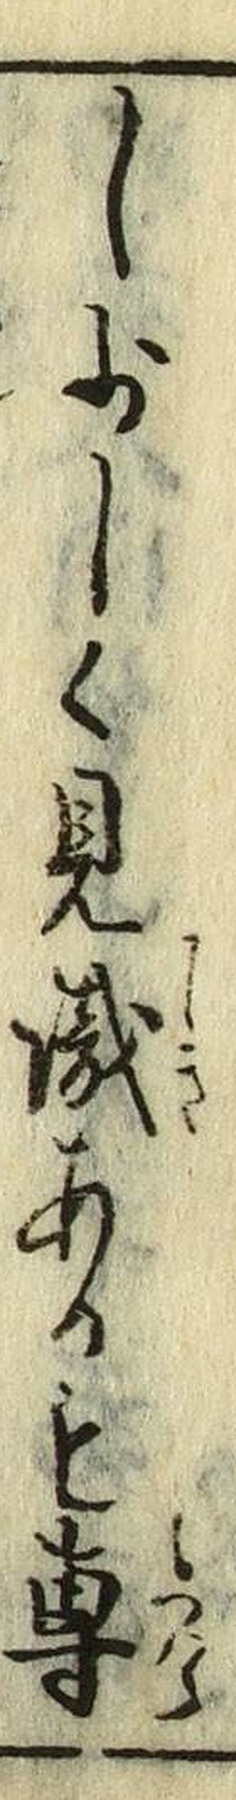し少しく見識あるも専
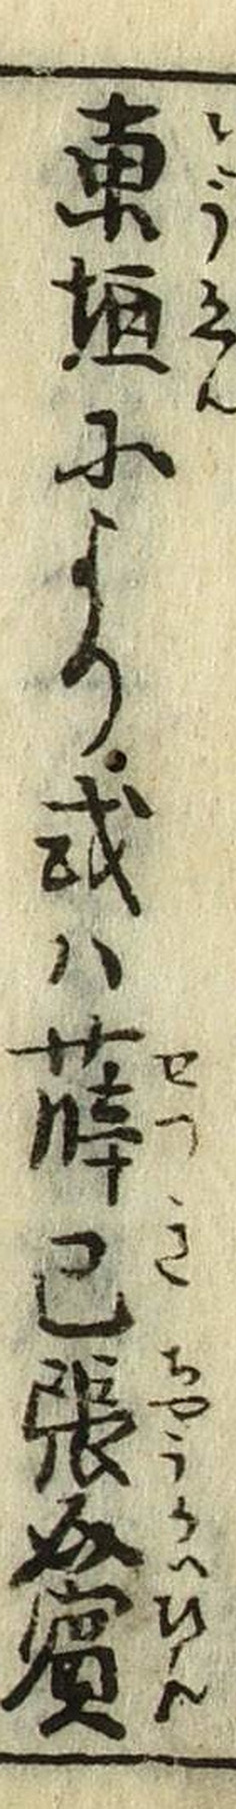東垣により。或は薛己張介賓
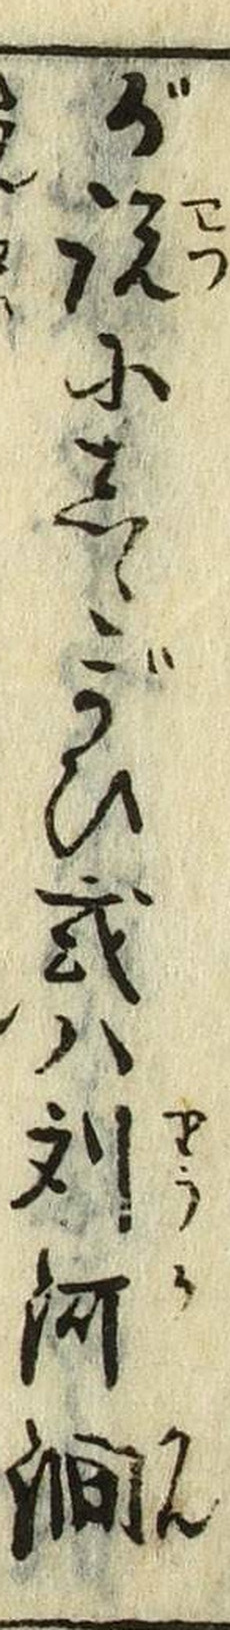が説にしたがひ或は劉河㵎
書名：居家養生記
